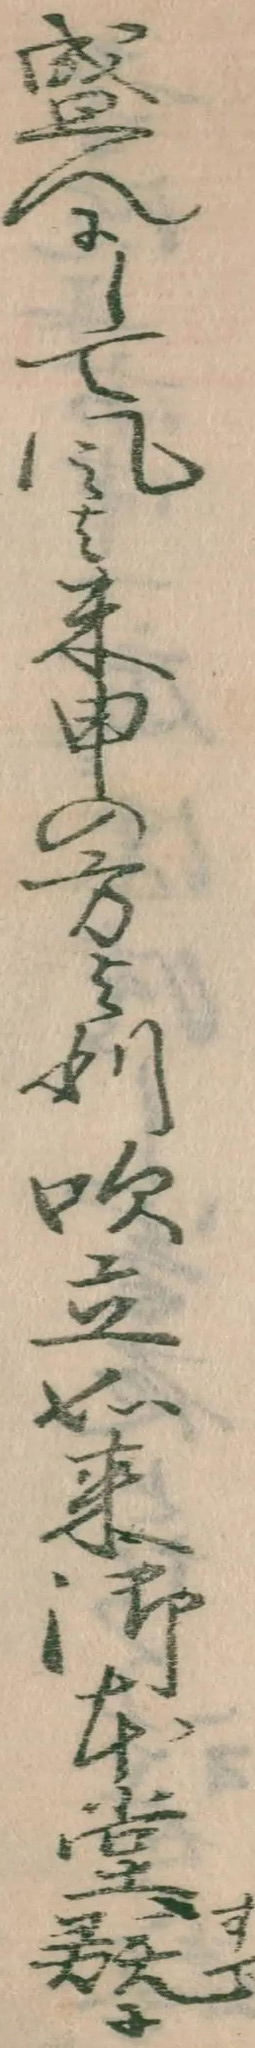盛んにして風は未申の方より吹立如来御本堂既に
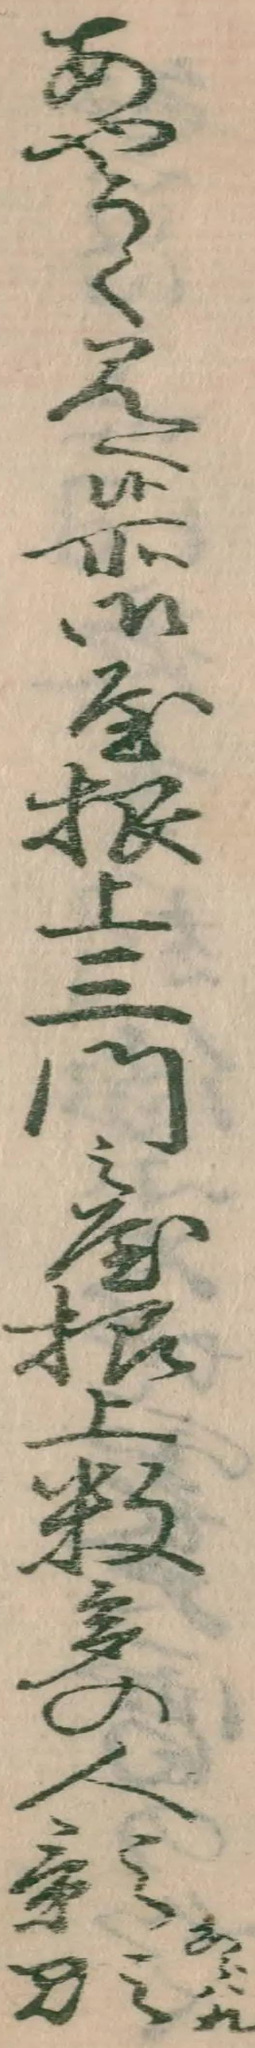あやうく見へ候所御屋根上三門之屋根上数多の人影顕
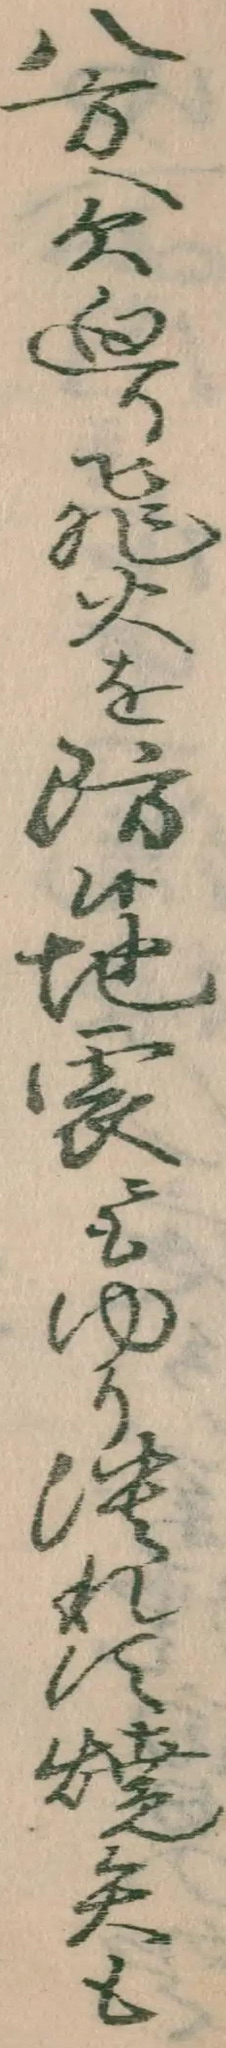八方へ欠廻り飛火を防候地震ニもゆり潰れす焼失も
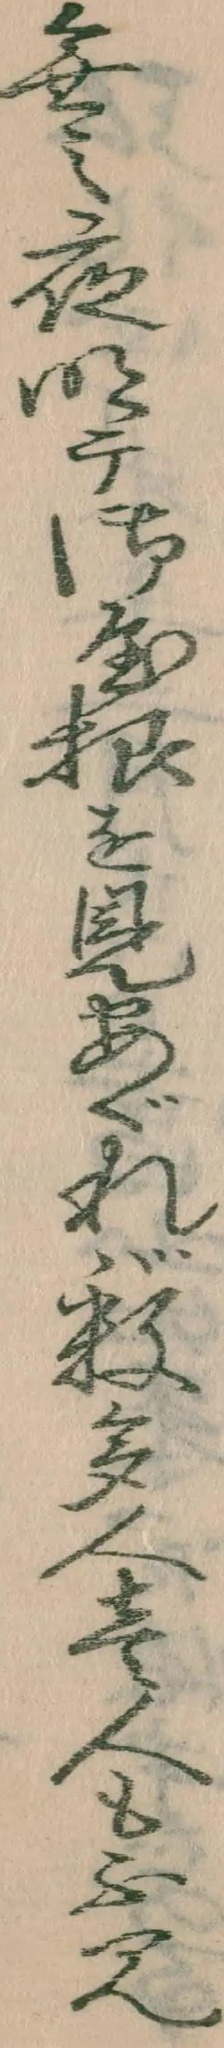無之夜明テ御屋根を見あぐれば数多人壱人も不見
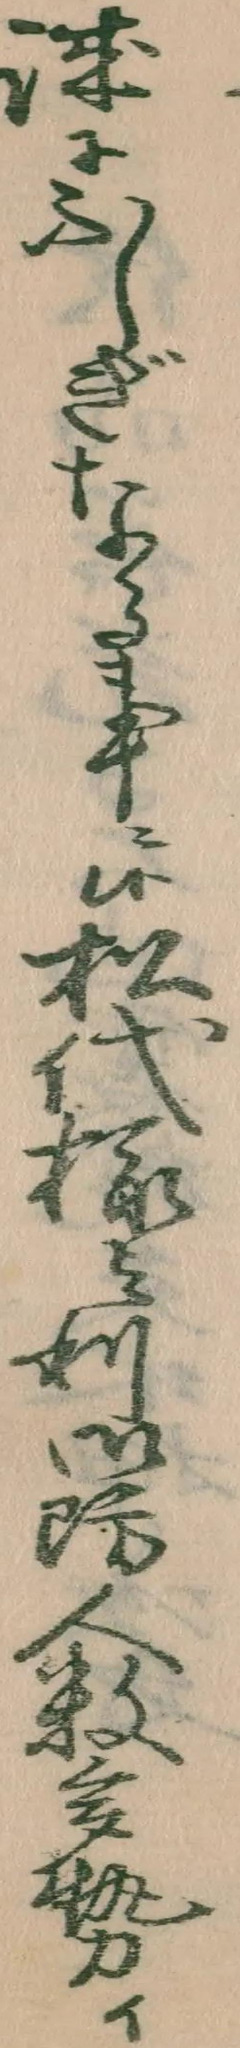誠にふしぎなる事ニ候松代様より御防人数多勢イ
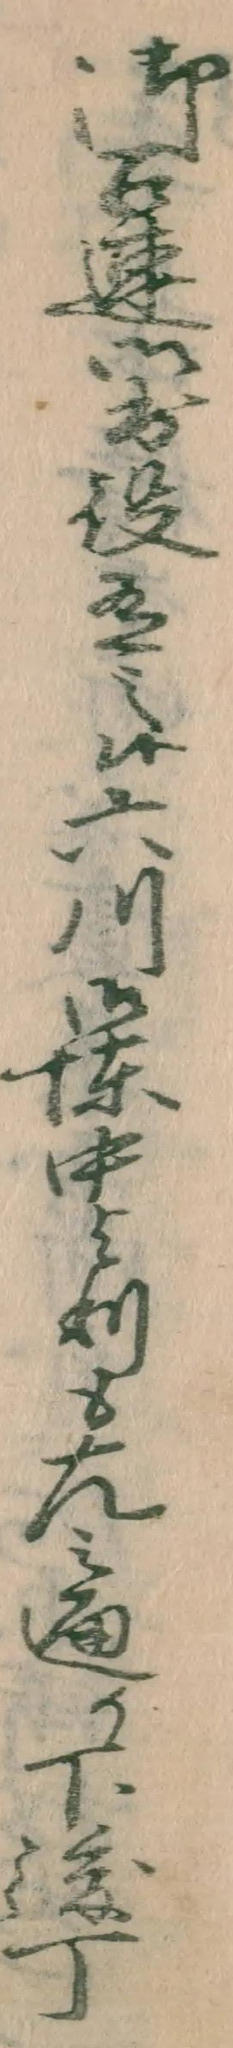御召連御出役有之候六川御陣中よりも左之通り下後丁
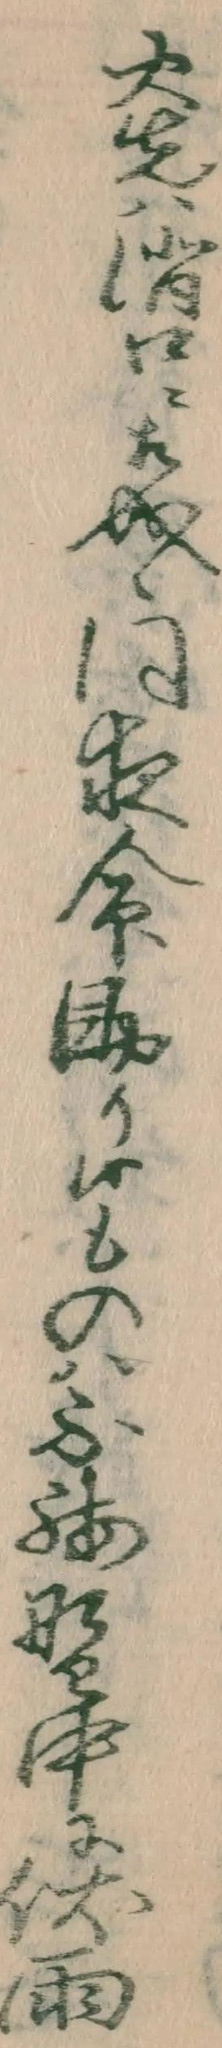火先は消口ニ相成候同夜命助り候ものは不残野中に伏雨
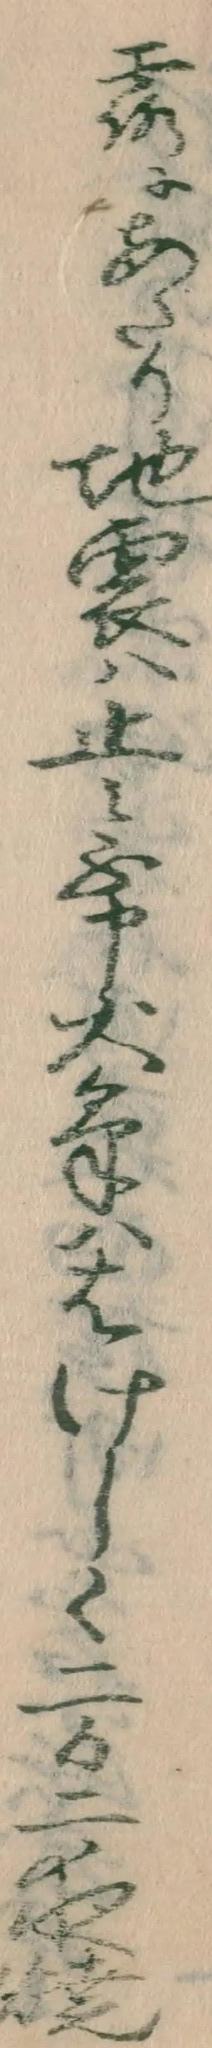露にあたり地震は止ミ不申火気ははけしく二日二夜焼
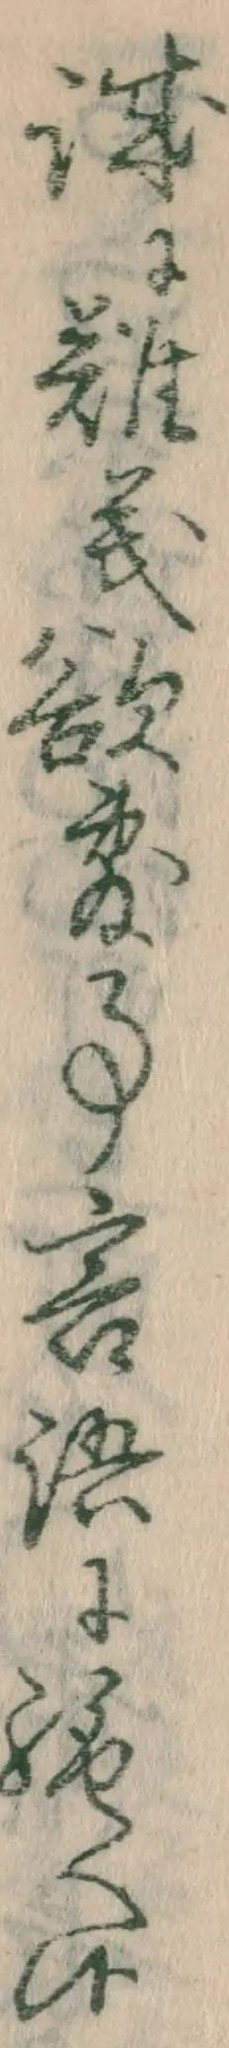誠に難義歎敷事言語に絶へ候
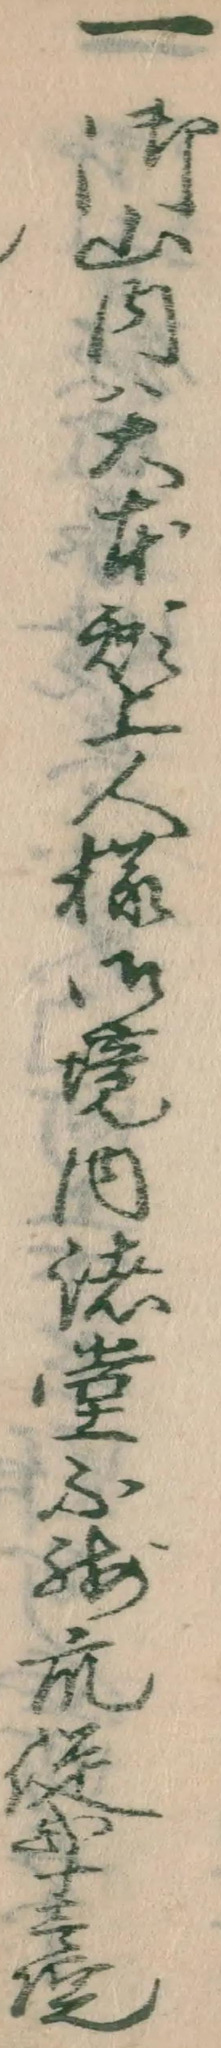一御山内は大本願上人様御境内諸堂不残衆従弐十壱院
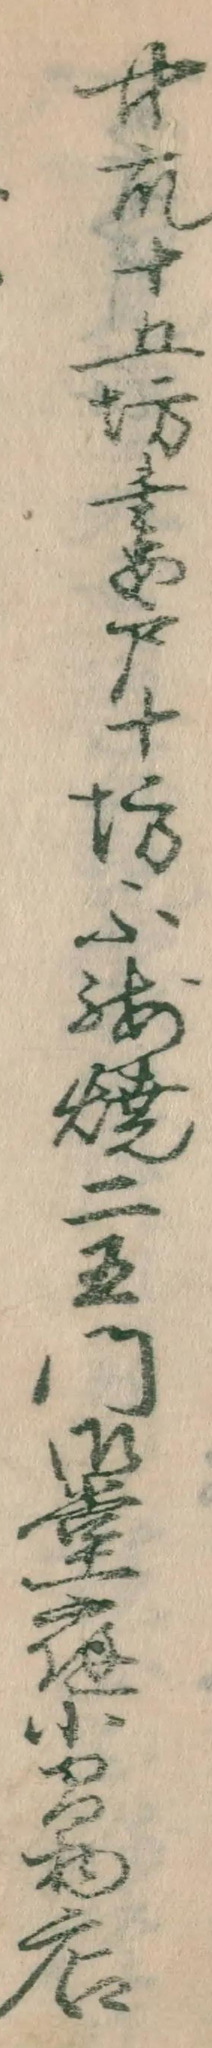中衆十五坊妻戸十坊不残焼二王門御堂庭小間物店
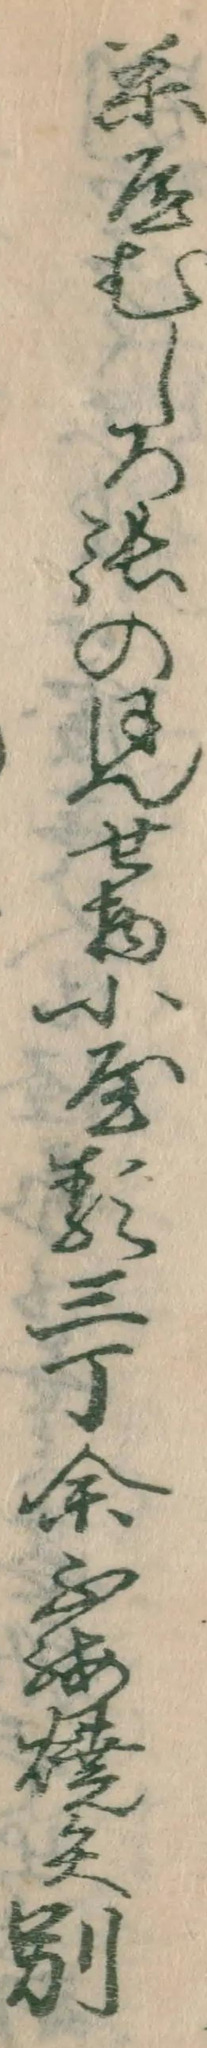茶屋むしろ張の見せ物小屋類三丁余不残焼失別
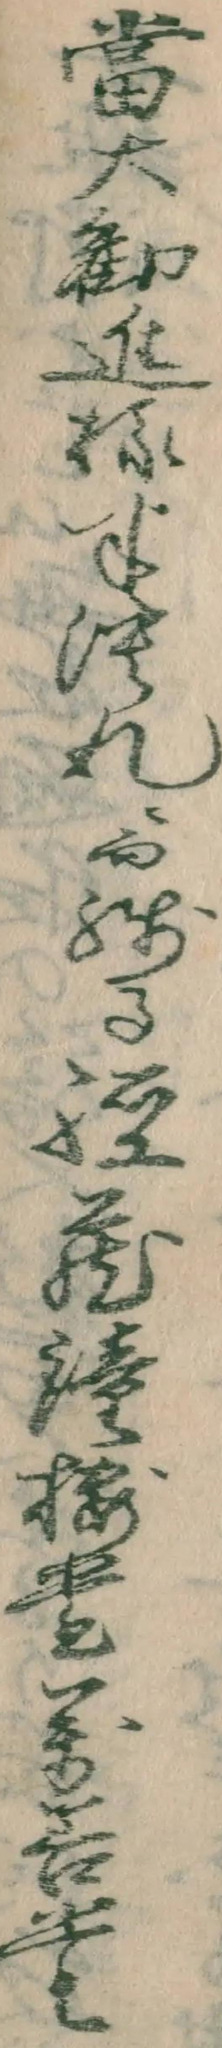当大勧進様半潰れニ而残る経蔵鐘楼堂万善堂

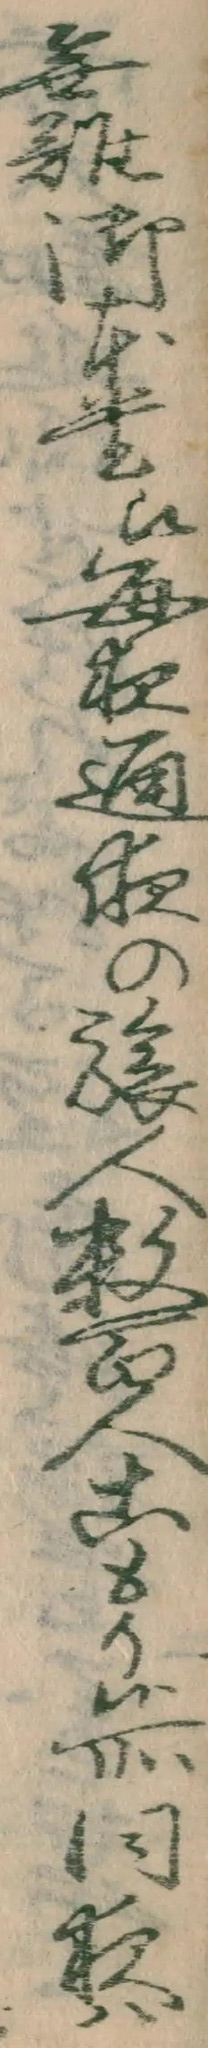無難御本堂え毎夜通夜の旅人数百人こもり候所同夜は
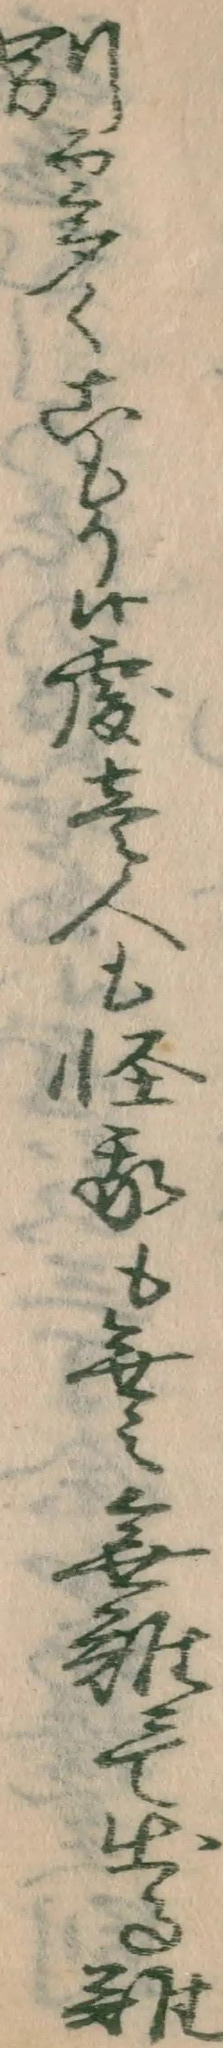別而多くこもり候處壱人も怪我も無之無難ニて出る難
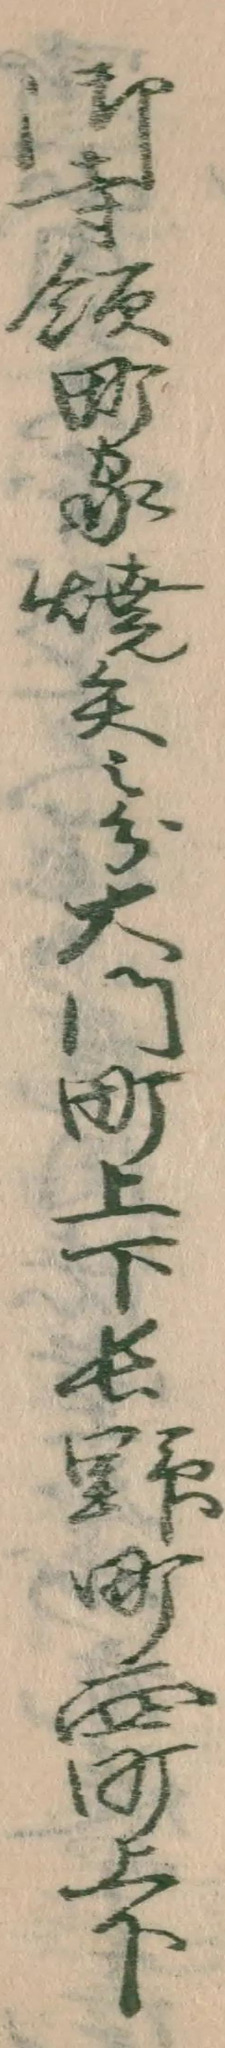一御寺領町家消失の分大門町上下長野町西町上下
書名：大地震
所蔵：国立国会図書館 National Diet Library, JAPAN
